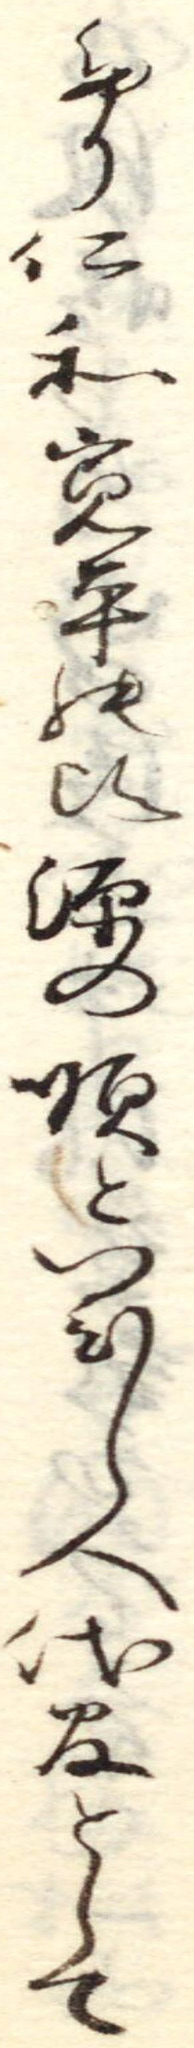たり仁和寛平の頃源の順といひし人代官として
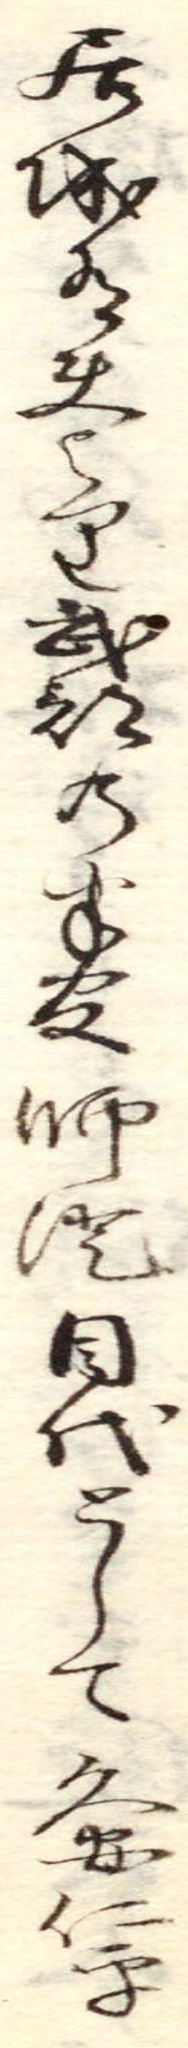居城有夫より武部の半官師澄目代として久安仁平
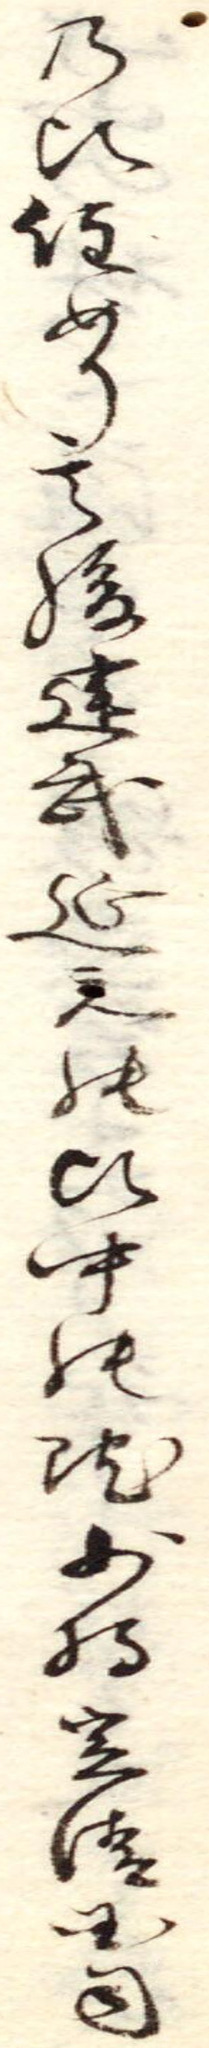の頃住めり其後建武延元の頃中の院少将定清国司
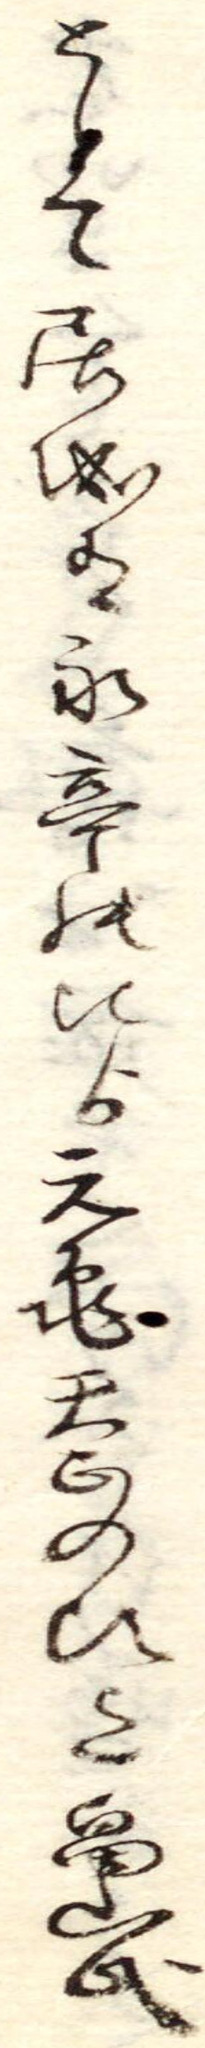として居城有永享の頃ゟ元亀天正の頃迄畠山氏
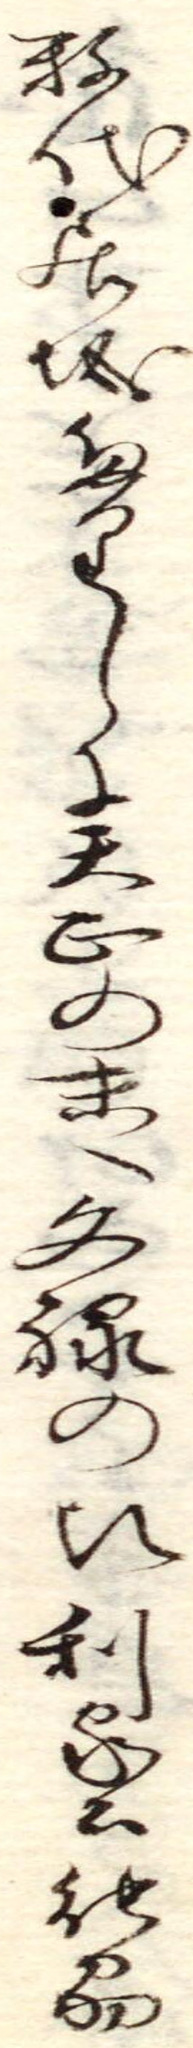数代居城たりしに天正の末へ文禄の頃利家公能州
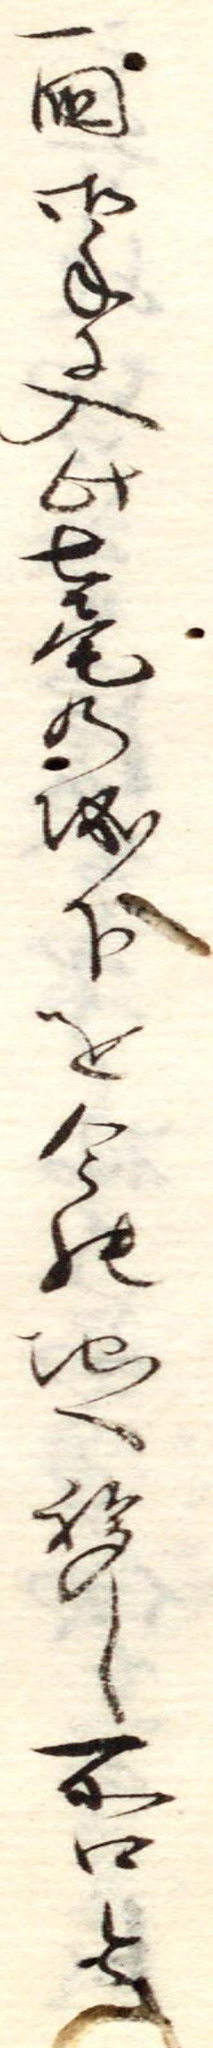一国御手に入此七尾の城下を今の地へ移し所口と
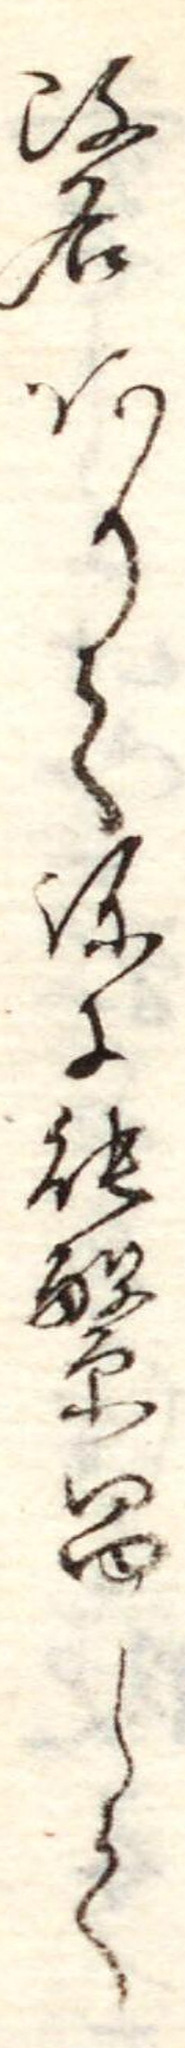改名ありて弥に能繁昌して
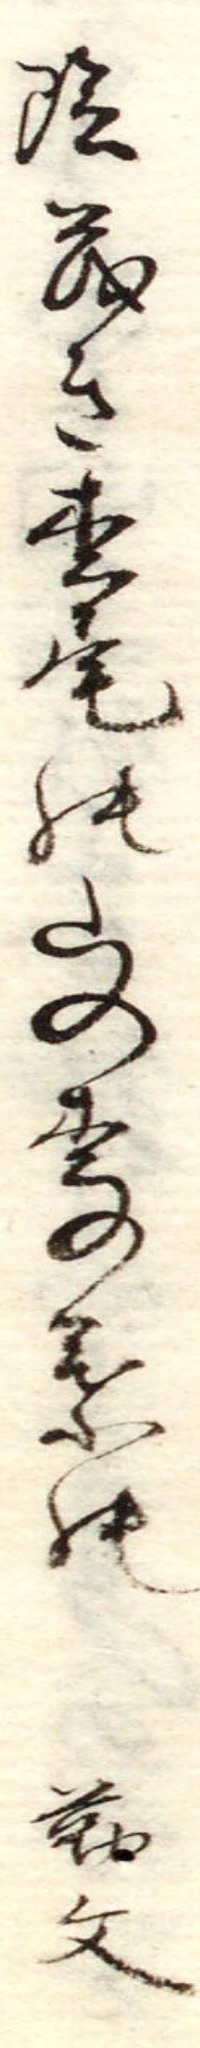陰茂き枩尾の山の枩の葉の勤文
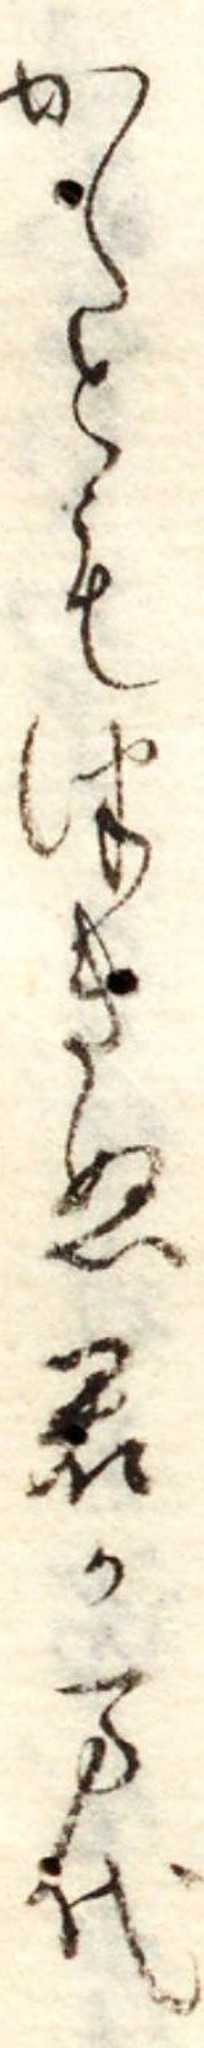かくともつきぬ君か万代
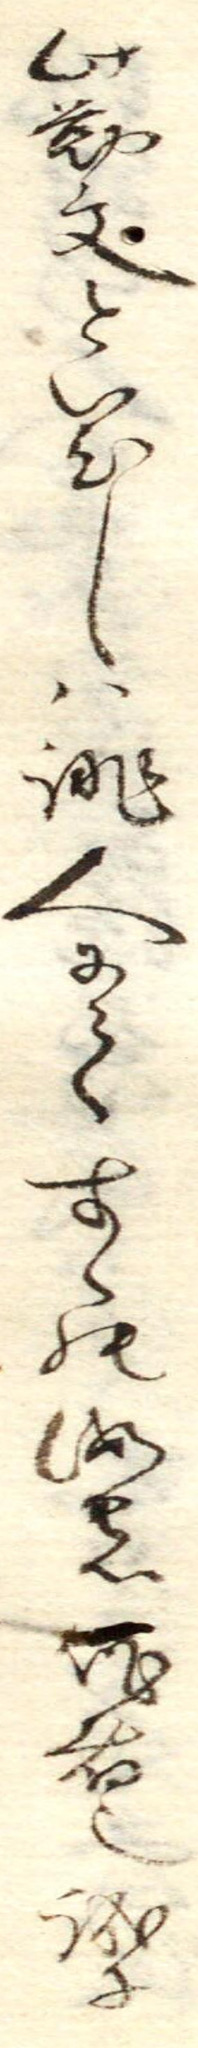此勤文といひしは俳人にてすゝの海の作者也誠に

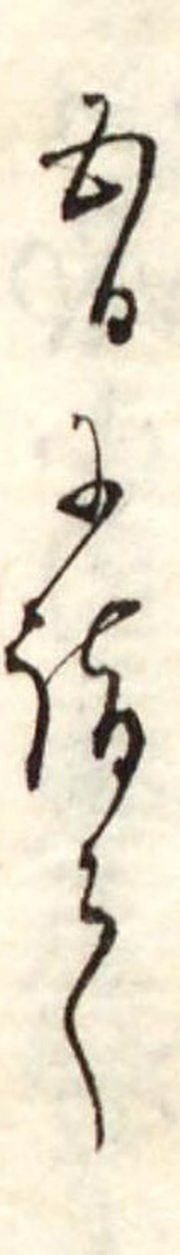五日に詣て
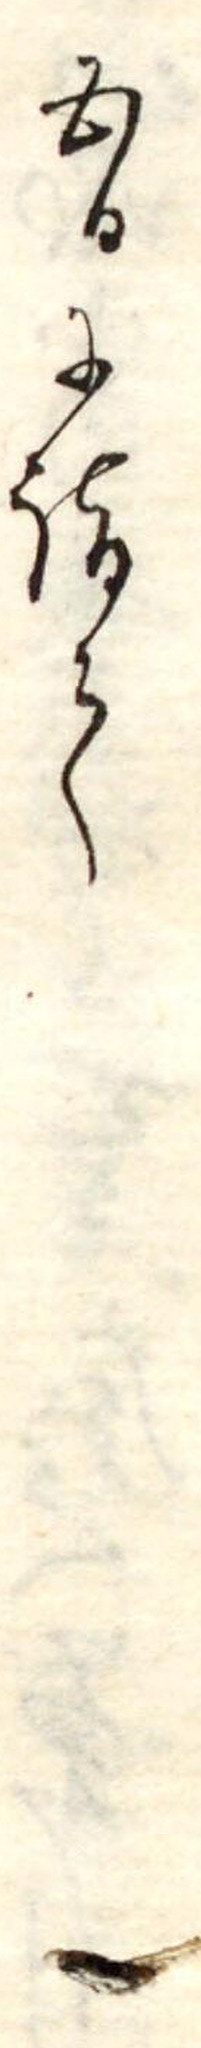五日に詣て
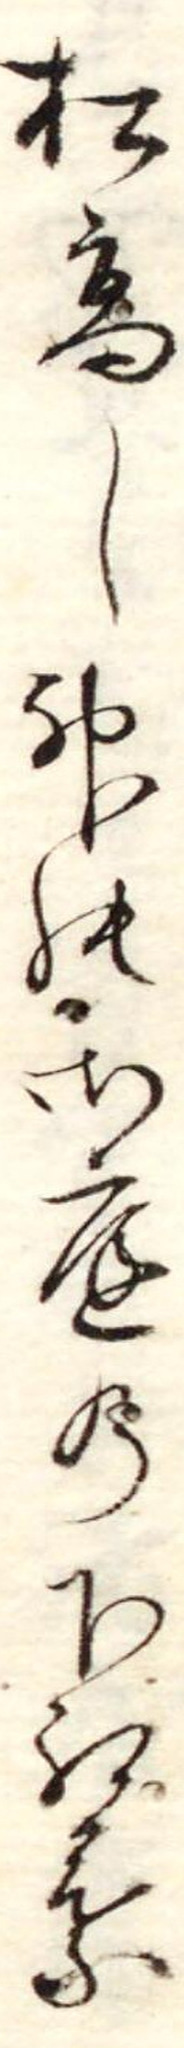松高し神の御庭の下紅葉
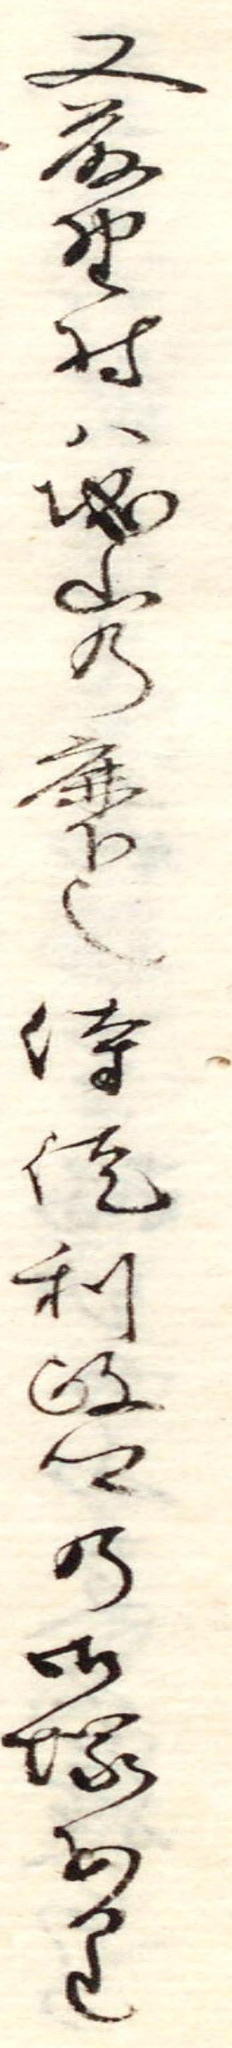又藤野村は城山の鹿下也侍従利政卿の御塚あり
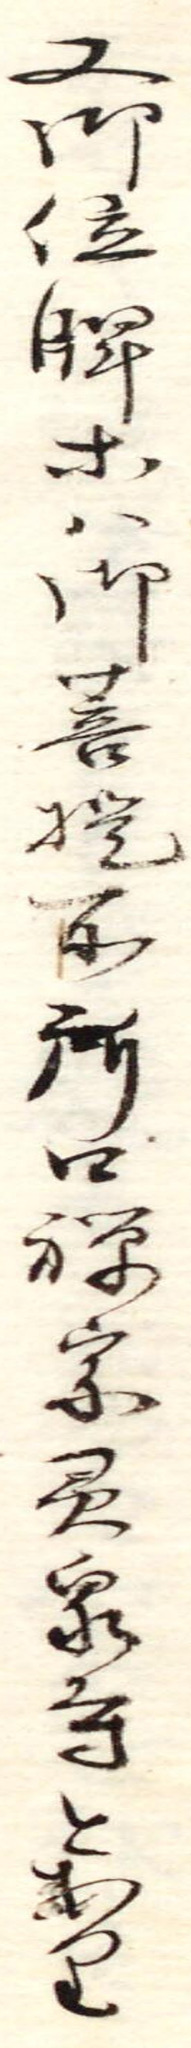又御位牌等は御菩提所所口禅宗霊泉寺とあり
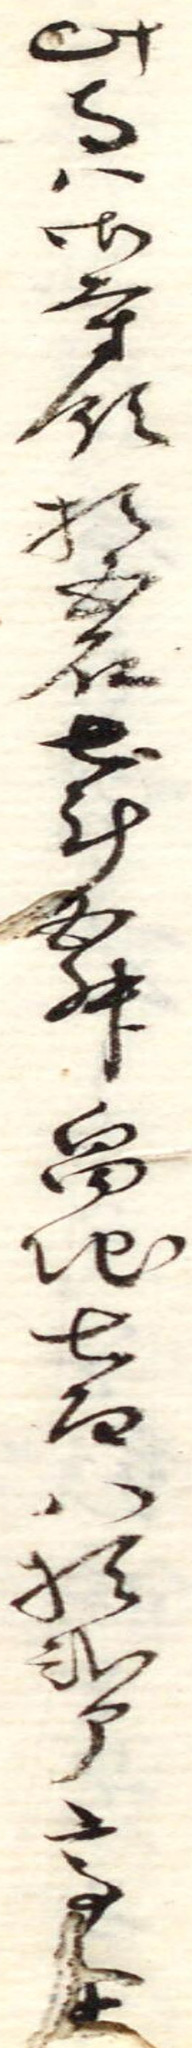此寺は御寺領拾五石七斗五升畠地七百八拾弐部高
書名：能登名跡誌
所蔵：Ishikawa Prefectural Library
